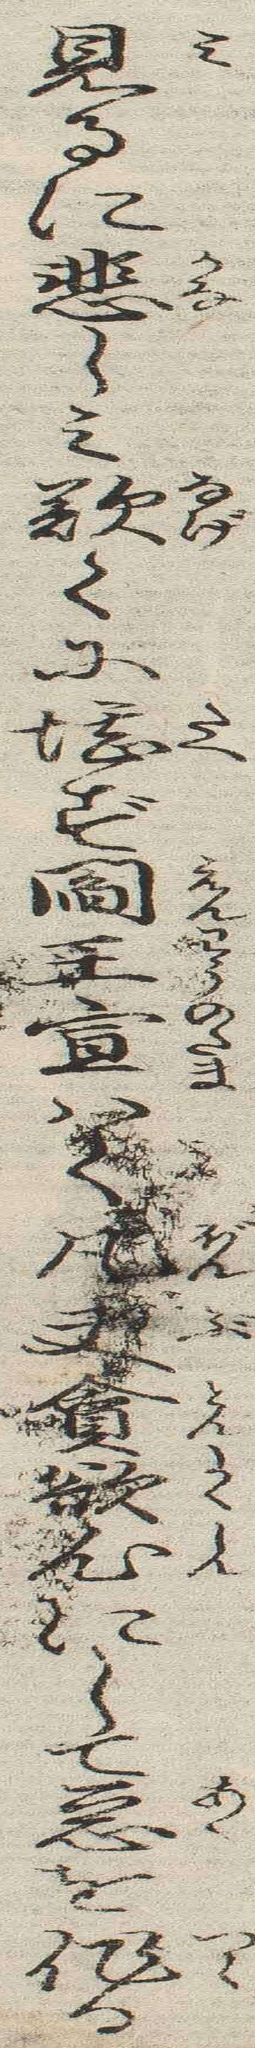見るに悲しみ歎くに堪ず閻王宣はく凡夫貪欲心にして悪を作る
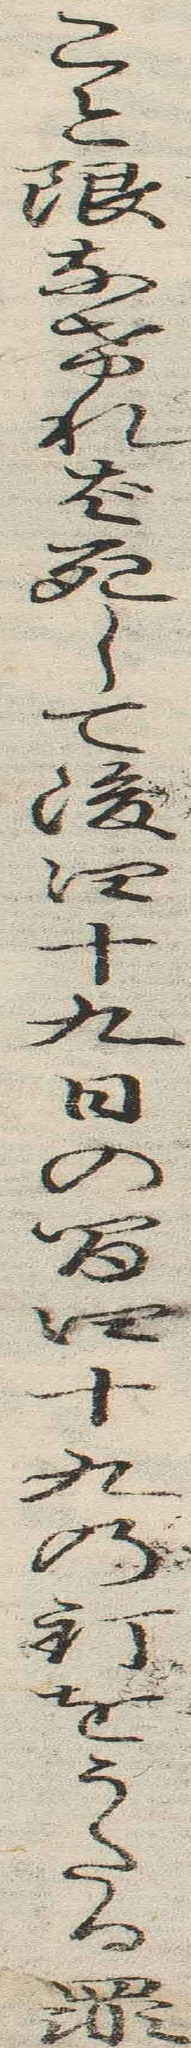こと限なければ死して後四十九日の間四十九の釘をうたる罪
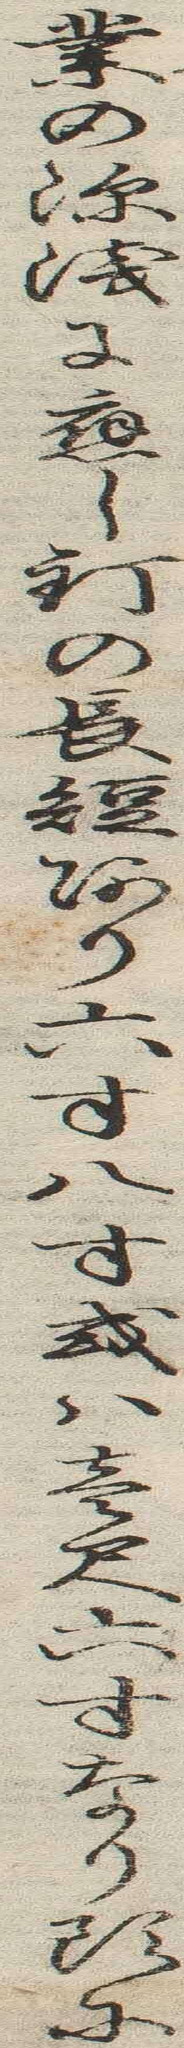業の深浅に應し釘の長短あり六寸八寸或は壱尺六寸なり頭に
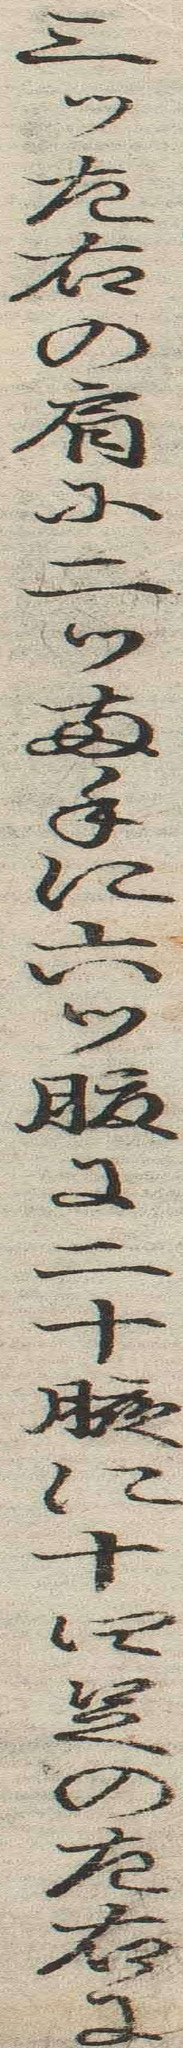三ッ左右の肩に二ッ両手に六ッ腹に二十腋に十四足の左右に
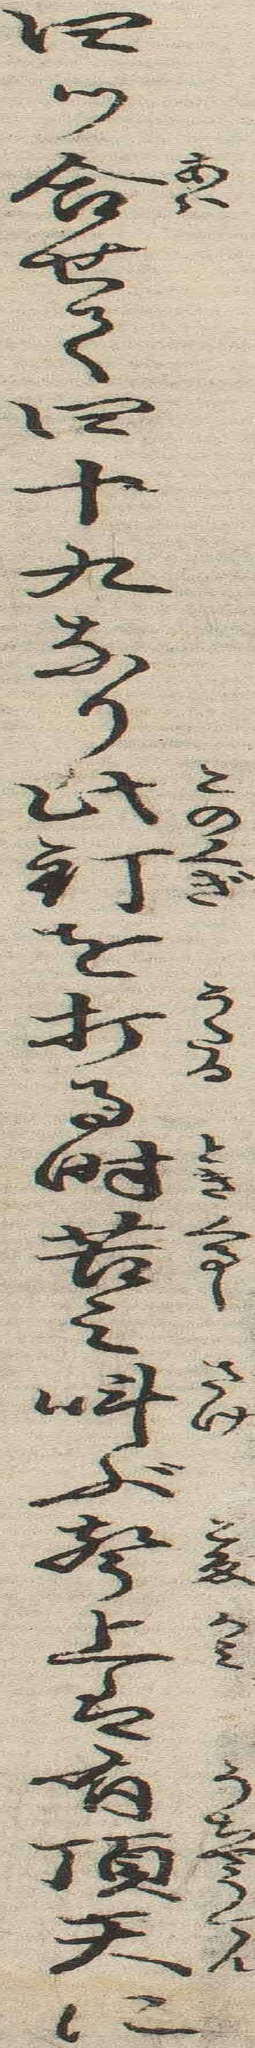四ッ合せて四十九なり此釘を打る时苦み叫ぶ聲上は有頂天に

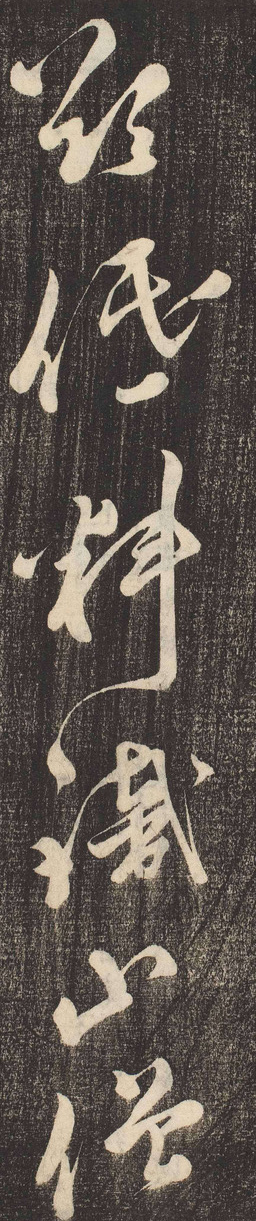欲低料識山僧

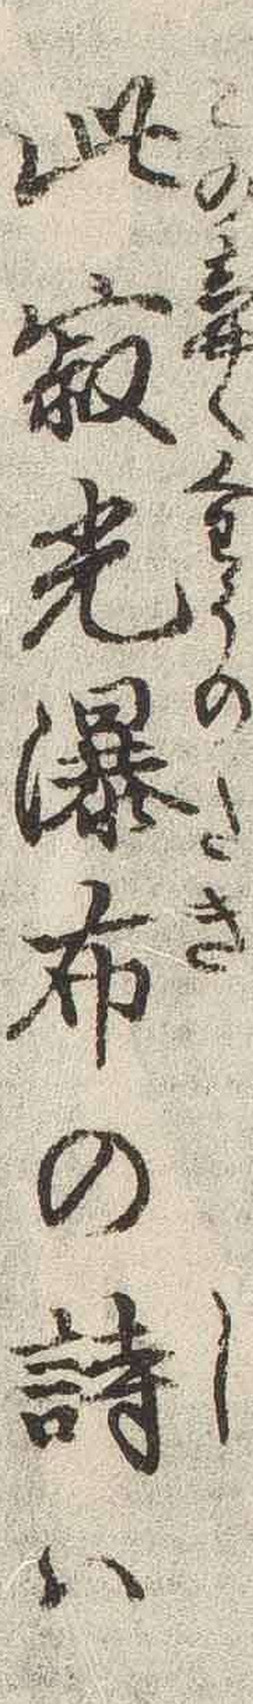此寂光瀑布の詩は
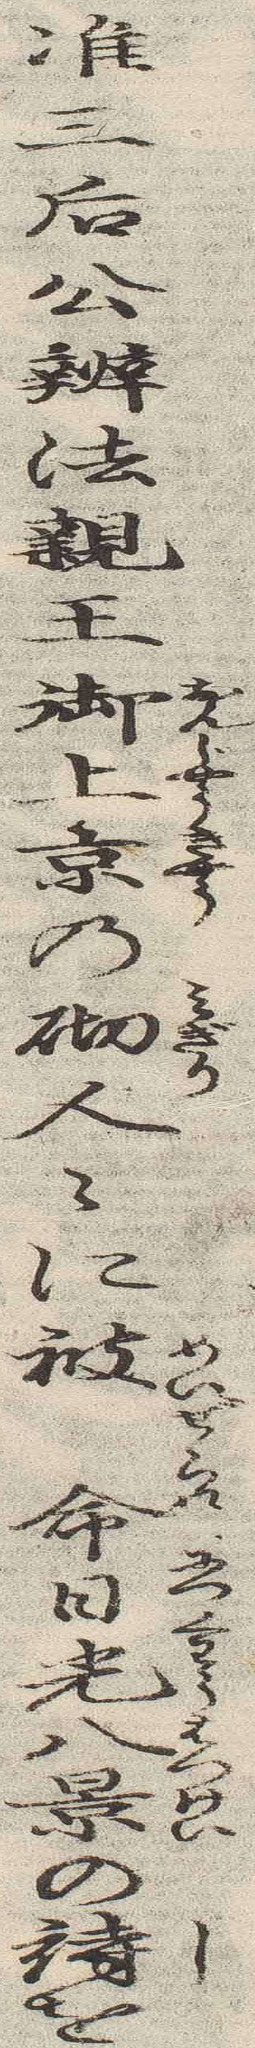准三后公辨法親王御上京の砌人〻に被命日光八景の詩を
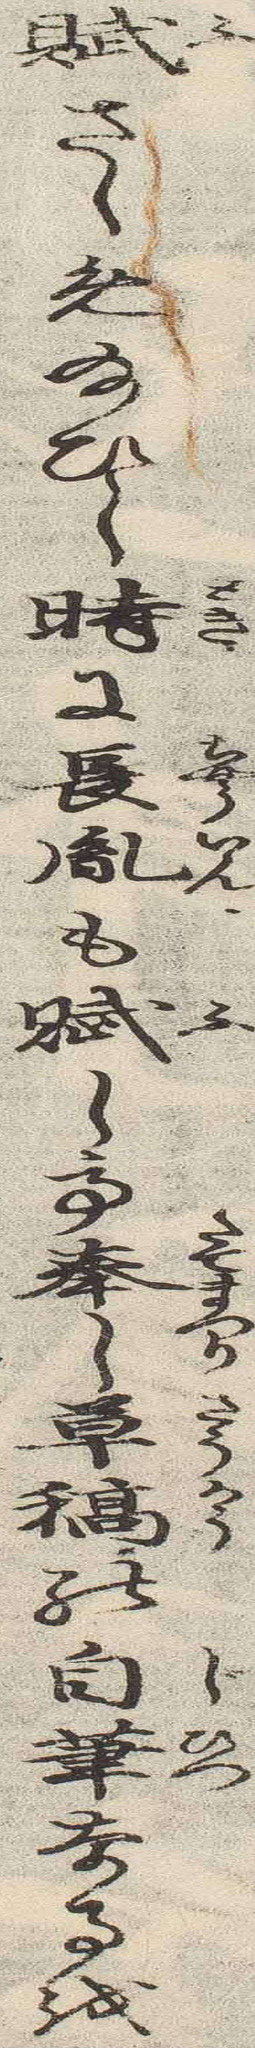賦さしめ給ひし時に長胤も賦しゝ事奉し草稿の自筆なるを
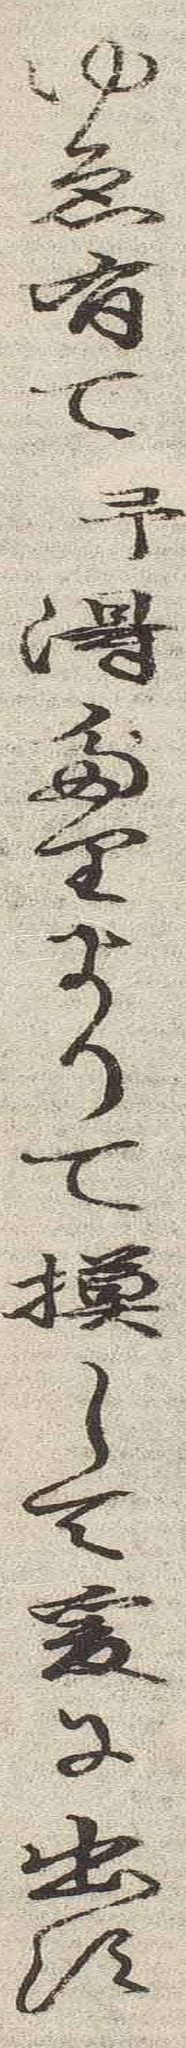ゆゑ有て予得たりよりて摸して爰に出す
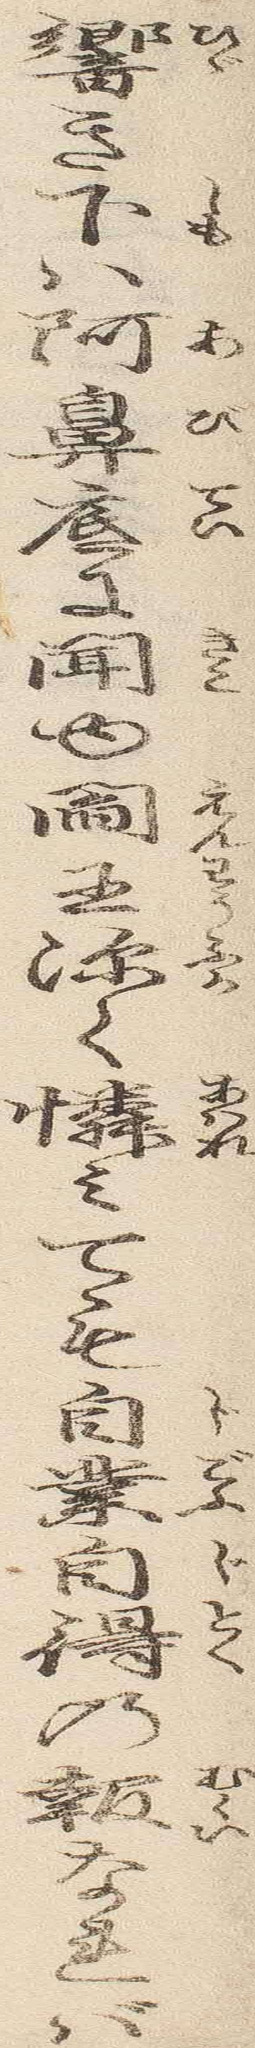響き下は阿鼻底に聞ゆ閻王深く憐みても自業自得の報なれば
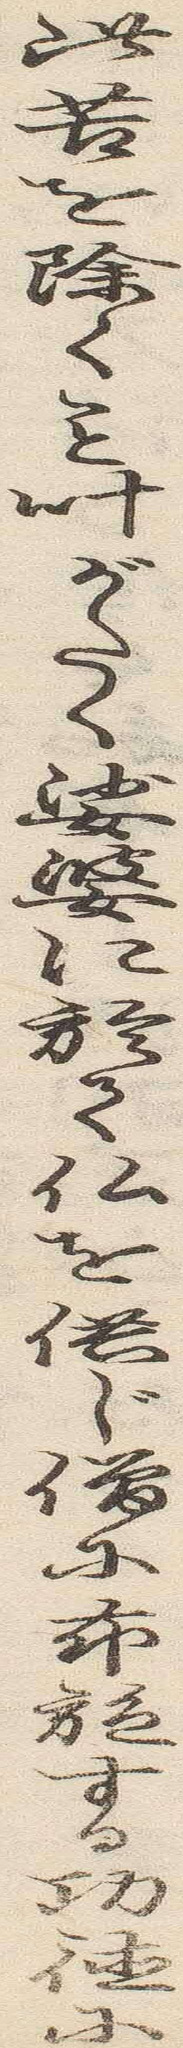此苦を除くこと叶がたく娑婆に於て仏を供じ僧に布施する功徳に
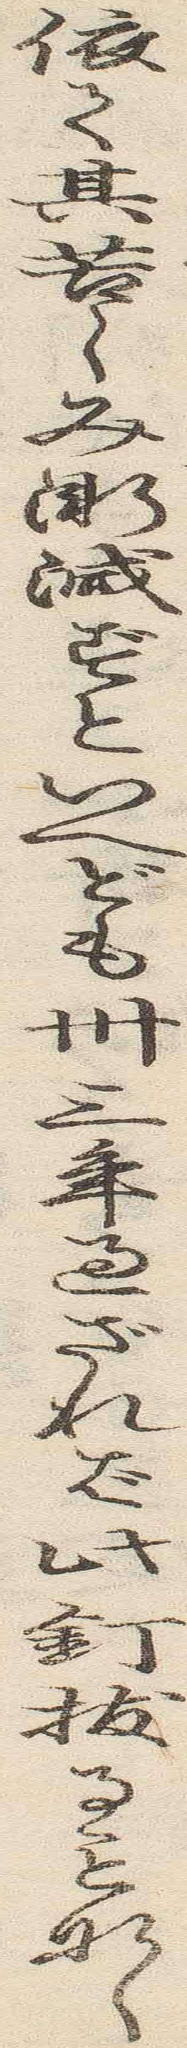依て其苦しみ漸減ずといへども卅三年過ざれば此釘抜ることなし
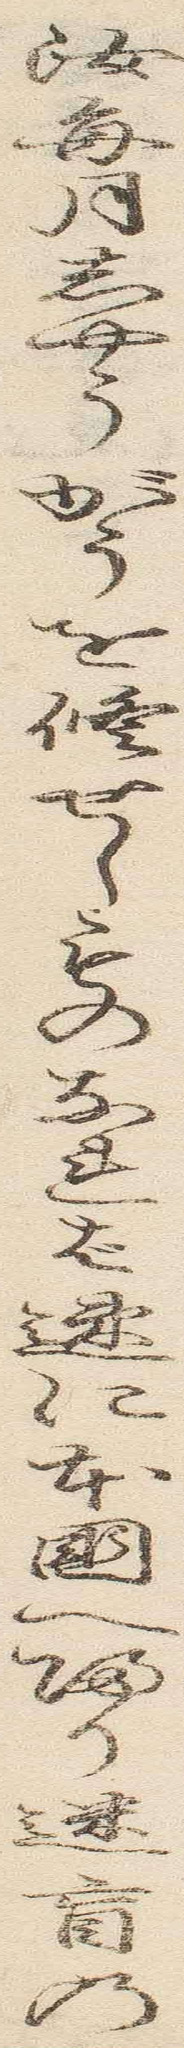汝毎月しやうがうを修せしものなれば速に本國へ帰り迷盲の
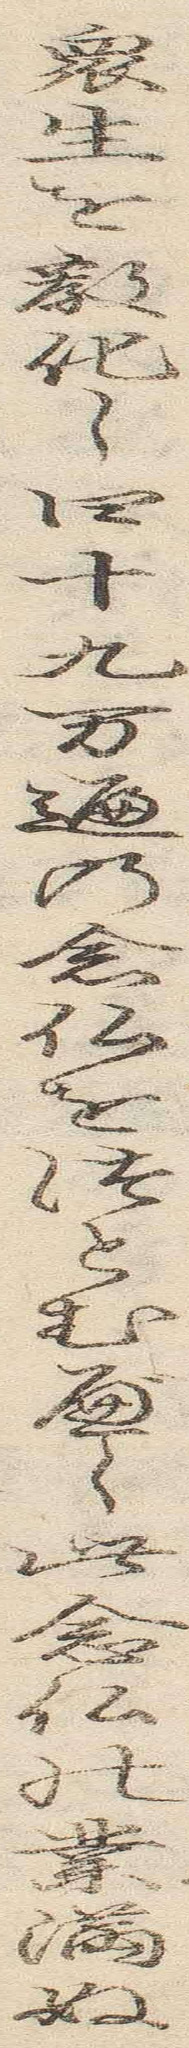衆生を敎化し四十九万遍の念仏をつとむべし此念仏の業満ぬ
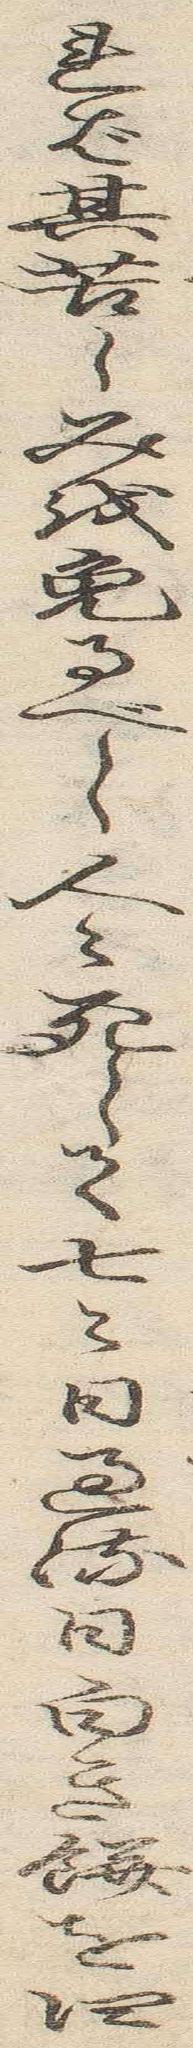れば其苦しみを免るべし人〻死して七〻日過る日白き餅を四
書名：日光山志
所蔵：東京学芸大学附属図書館 国文学研究資料館
